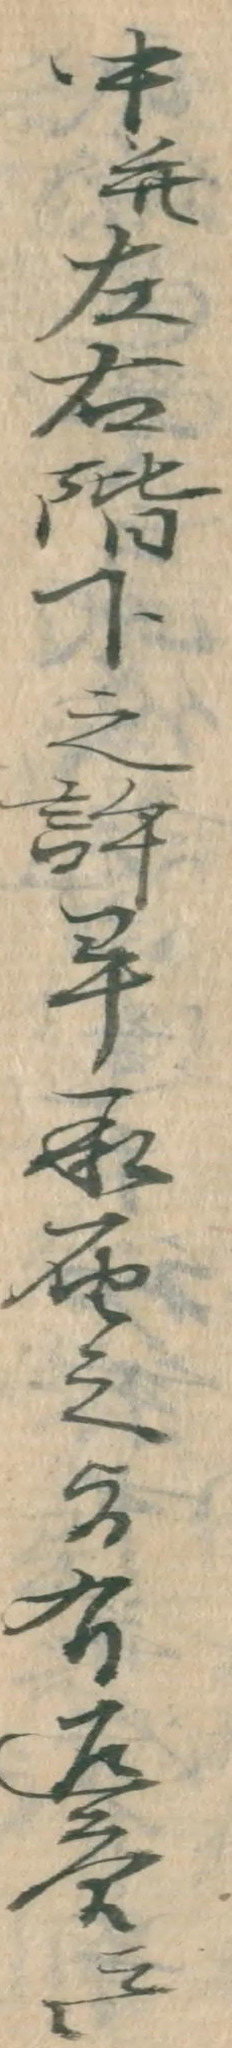中并左右階下之許畢承届之旨有返答云々
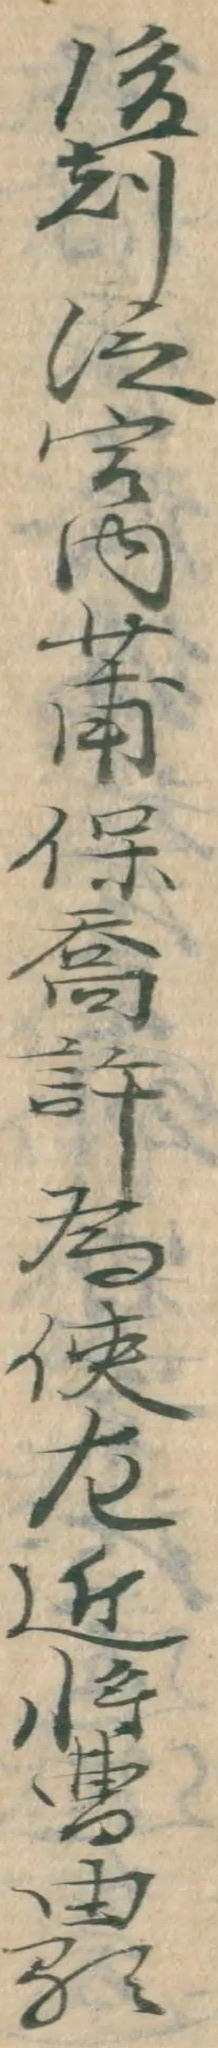後刻従宮内少輔保喬許為使左近将曹由顕
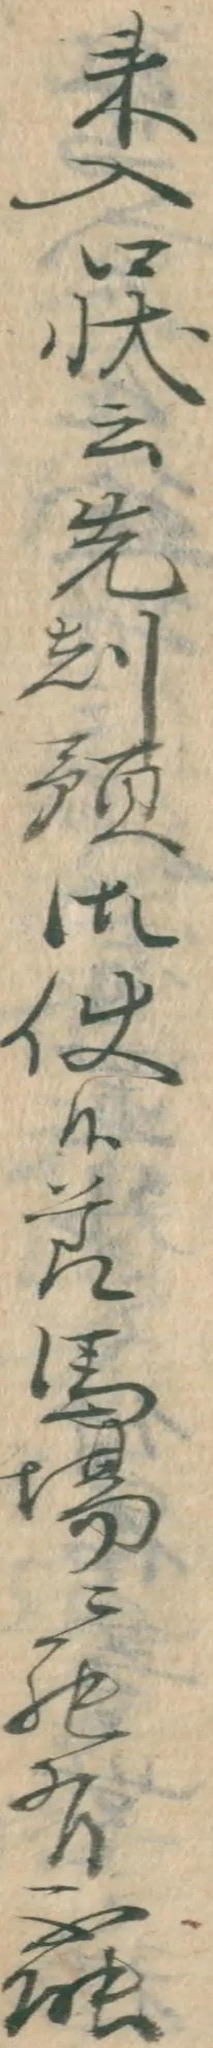来入口状云先刻預御使候節馬場ニ罷有不能
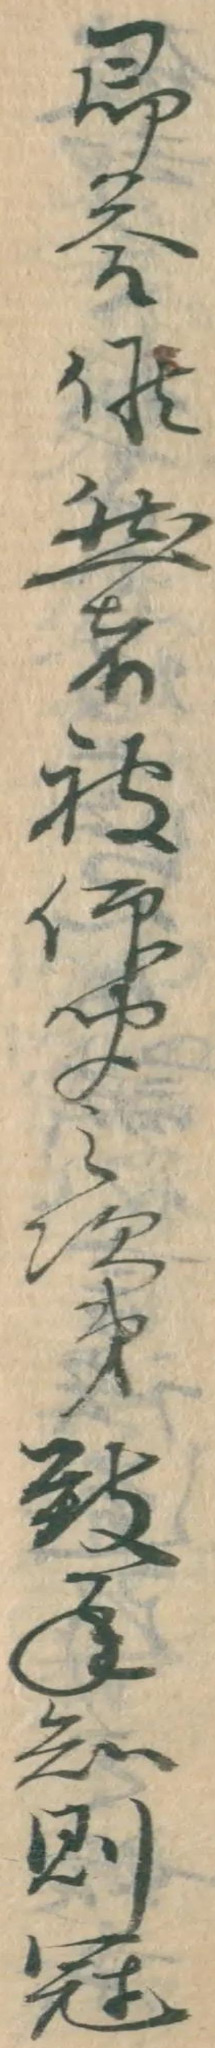即答候然者被仰聞之次第致承知則冠

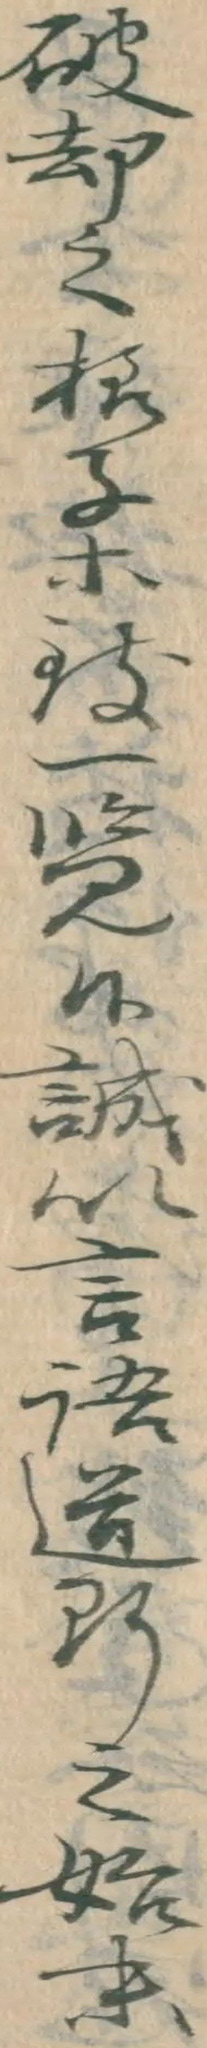破却之様子等致一覧候誠以言語道断之始末
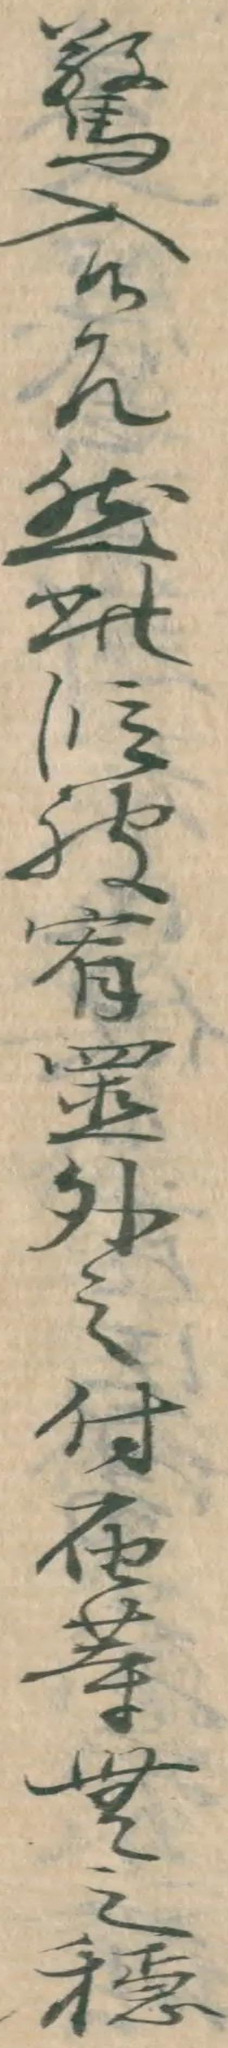驚入候乍然此段彼宥置外之付届等無之穏
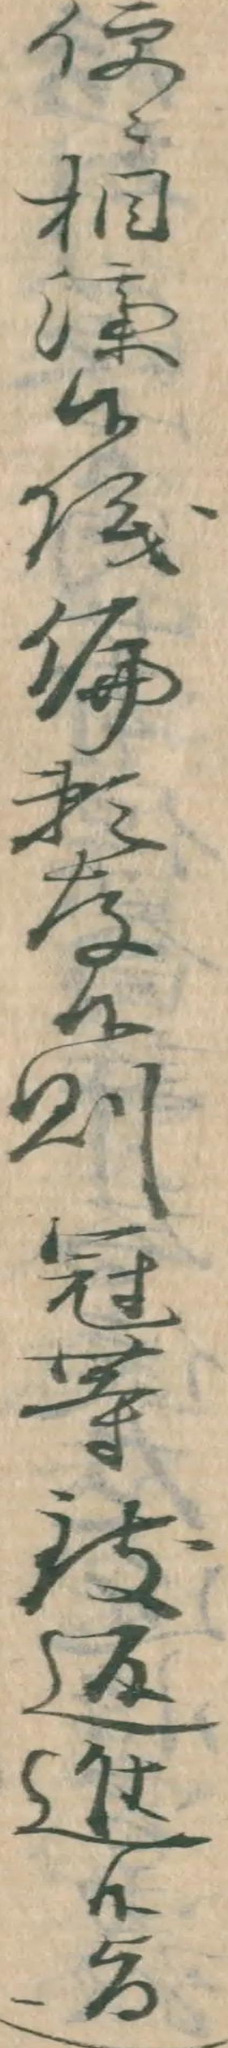便二相済候儀偏頼存候則冠等致返進候旨也
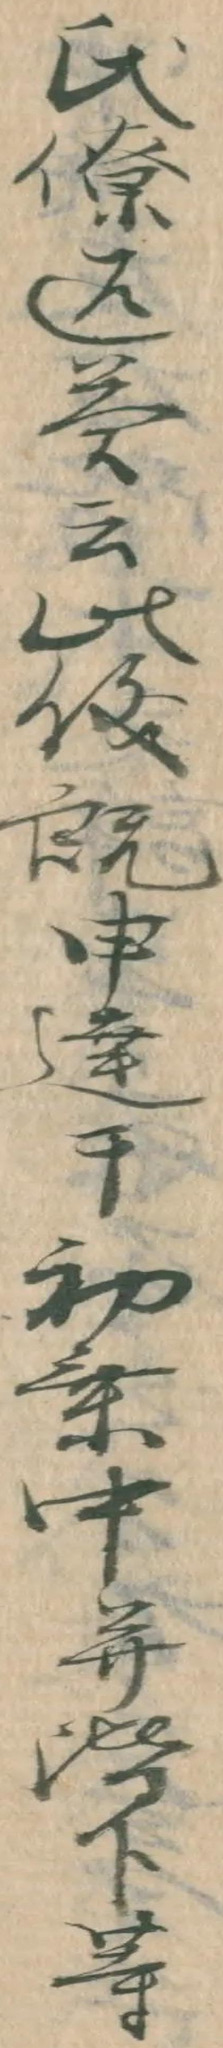氏僚返答云此儀既申達于初乗中并階下等
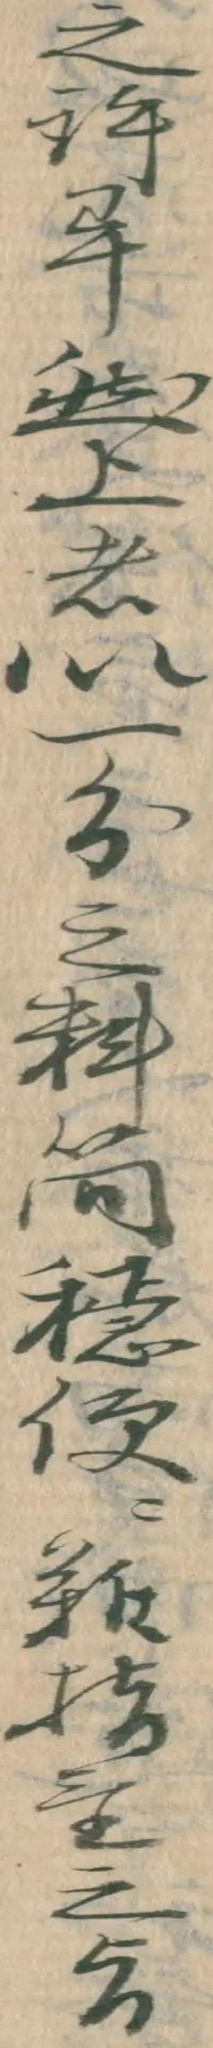之許畢然上者以一分之料簡穏便ニ難指置之旨
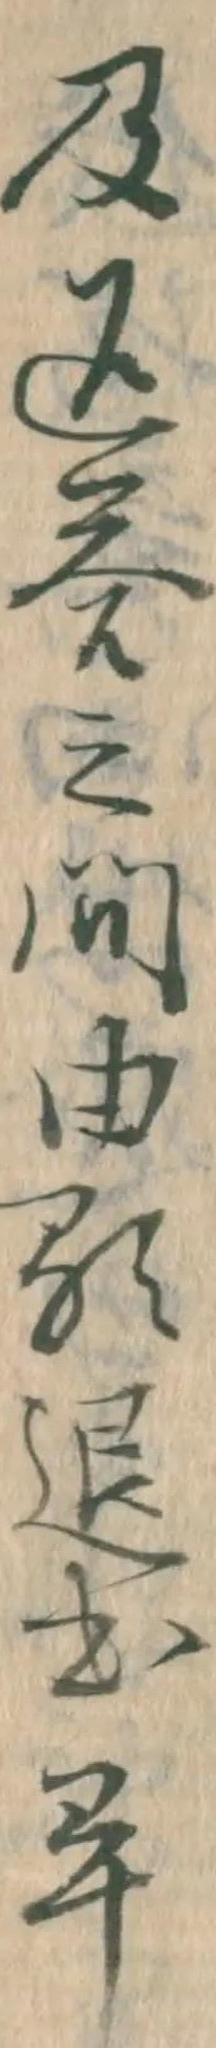及返答之間由顕退出畢
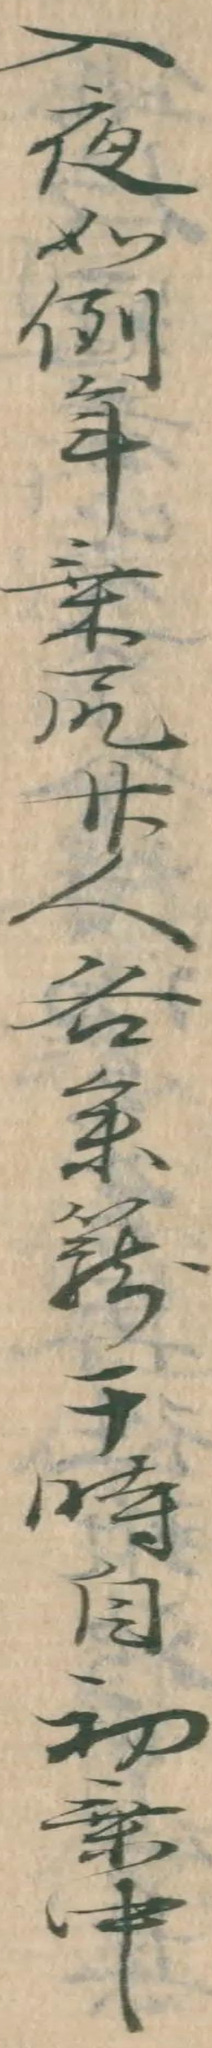入夜如例年乗尻廿人各参籠于時自初乗中
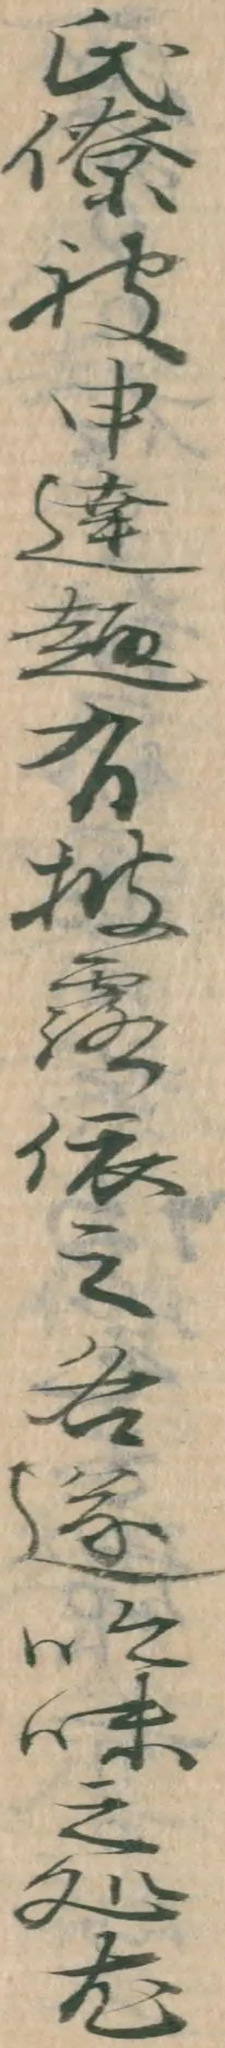氏僚被申達趣有披露依之各遂吟味之処尤
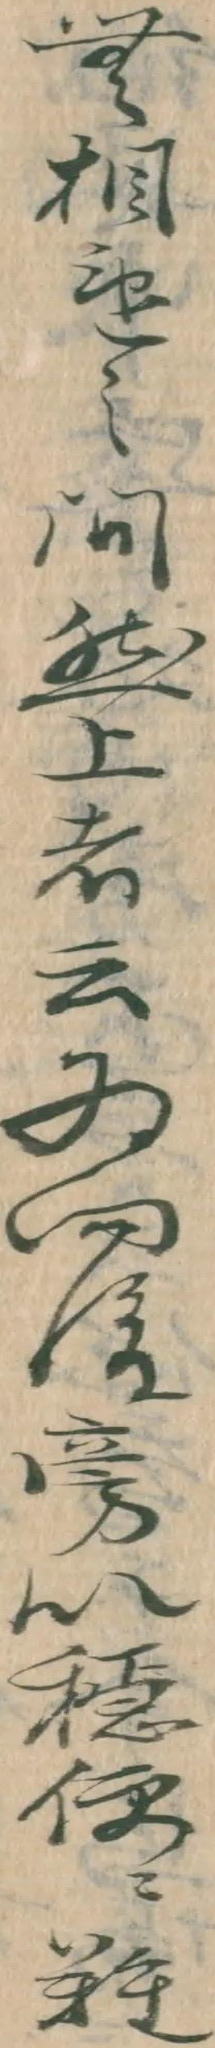無相違之間然上者云為向後旁以穏便ニ難
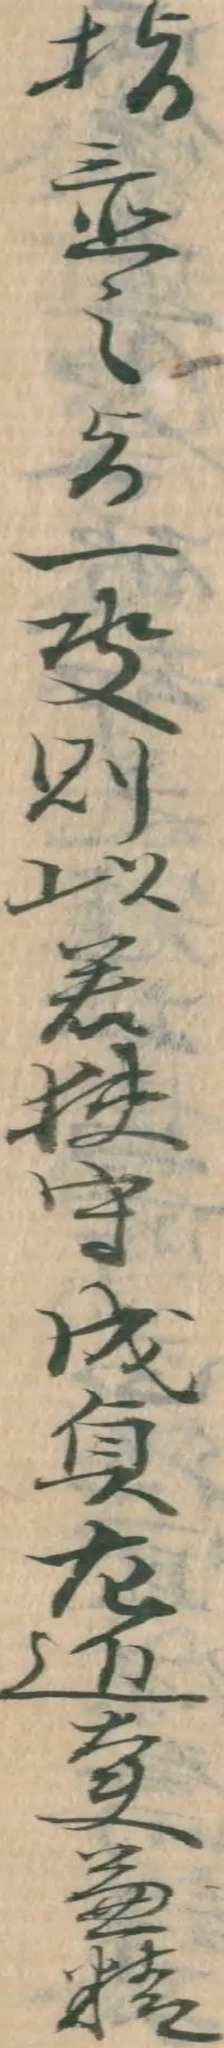指置之旨一決則以若狭守成貞左近大夫兼精
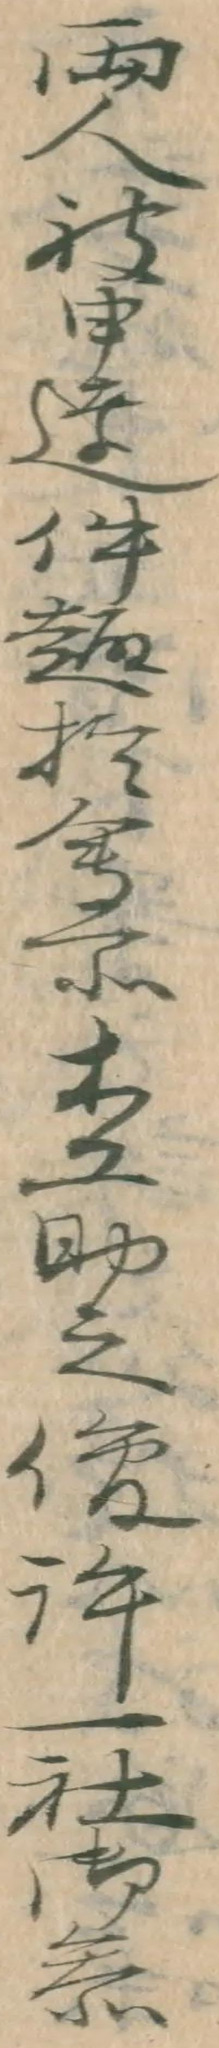両人被申達件趣於会所木工助之僧許一社御参
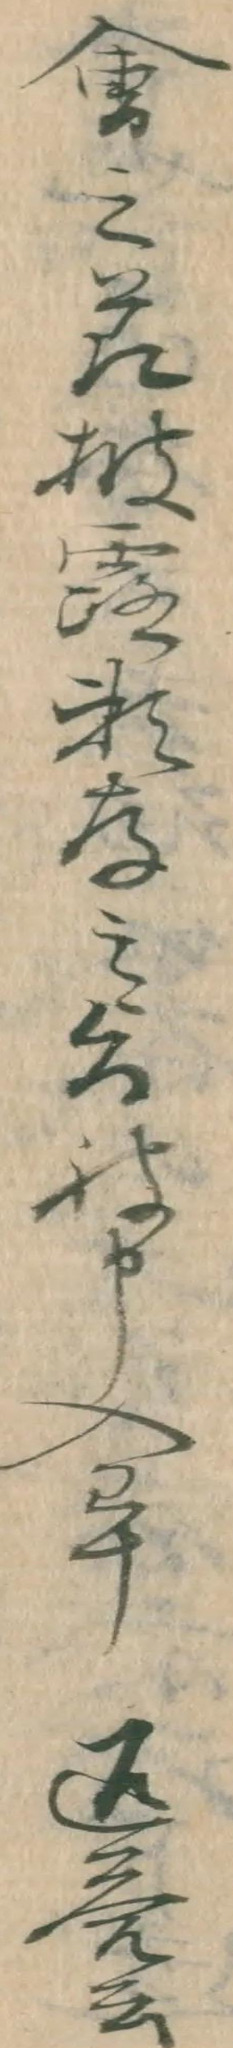会之節披露頼存之旨被申入畢返答云
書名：賀茂社記録. 第10冊
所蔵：国立国会図書館 National Diet Library, JAPAN
